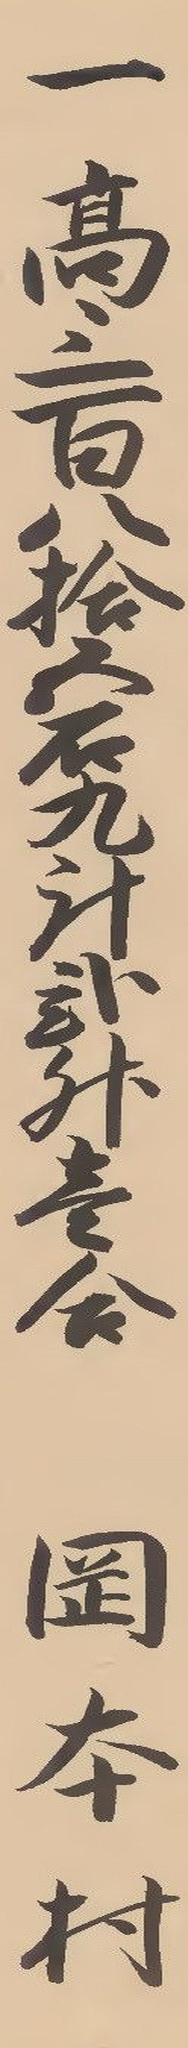一高三百八拾五石九斗弐升壱合岡本村
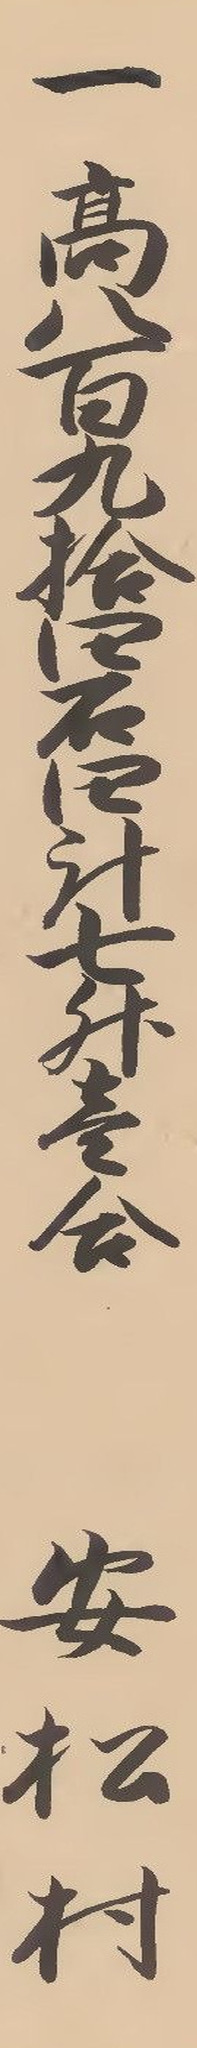一高八百九拾四石四斗七升壱合安松村
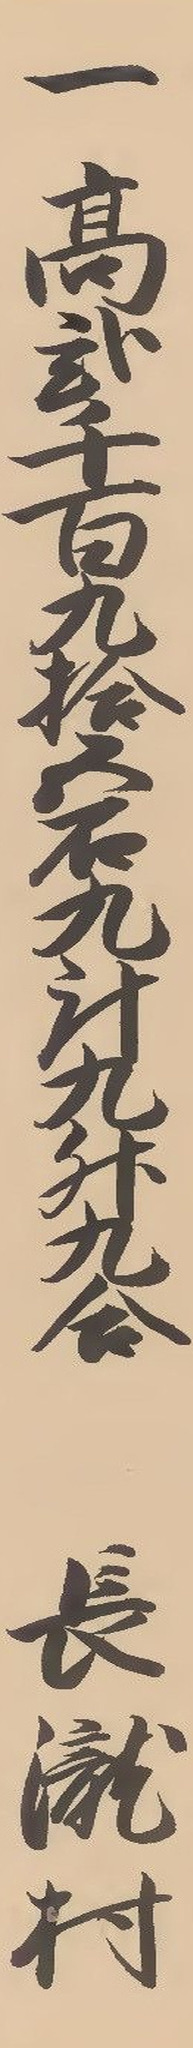一高弐千百九拾五石九斗九升九合長滝村
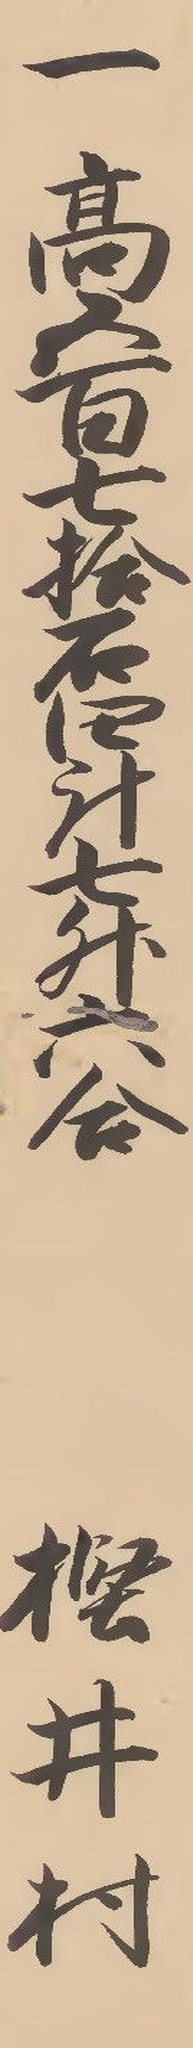一高五百七拾石四斗七升六合樫井村

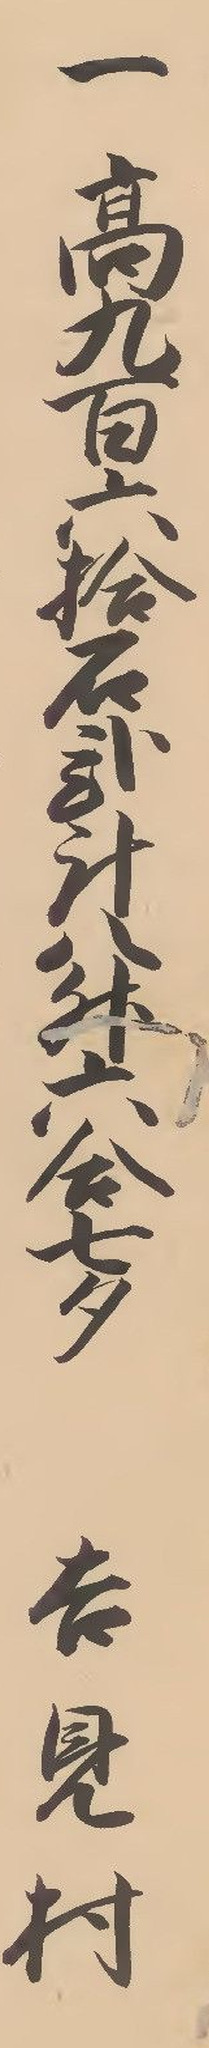一高九百六拾石弐斗八升六合七勺吉見村
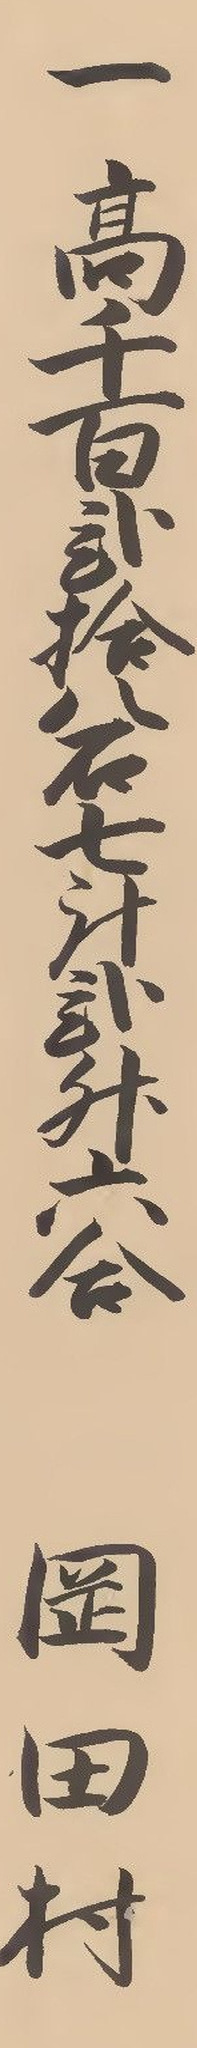一高千百弐拾八石七斗弐升六合岡田村
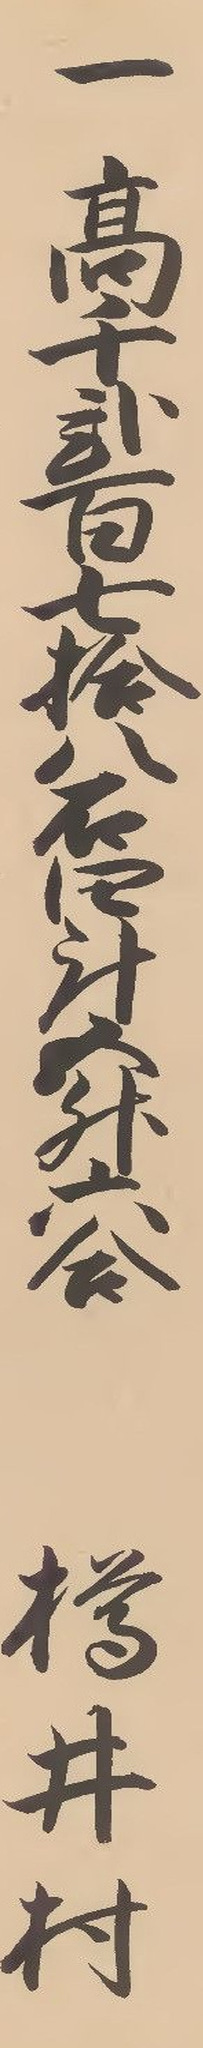一高千弐百七拾八石四斗五升六合樽井村
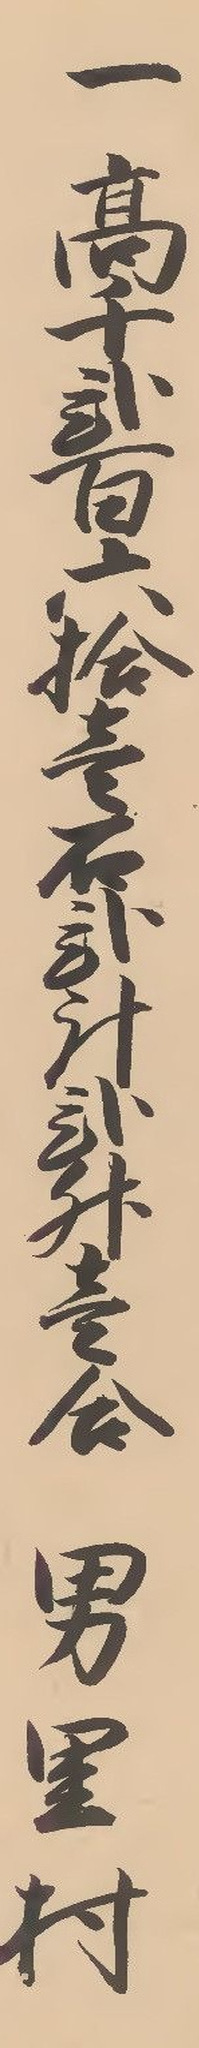一高千弐百六拾壱石弐斗弐升壱合男里村
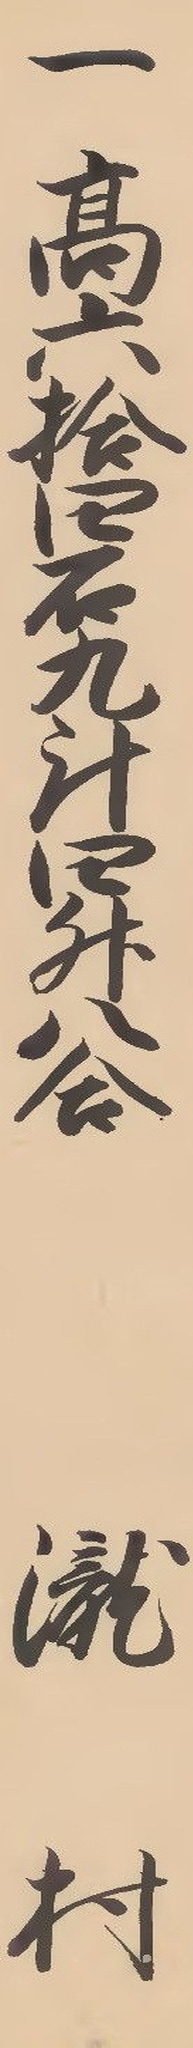一高六拾四石九斗四升八合滝村
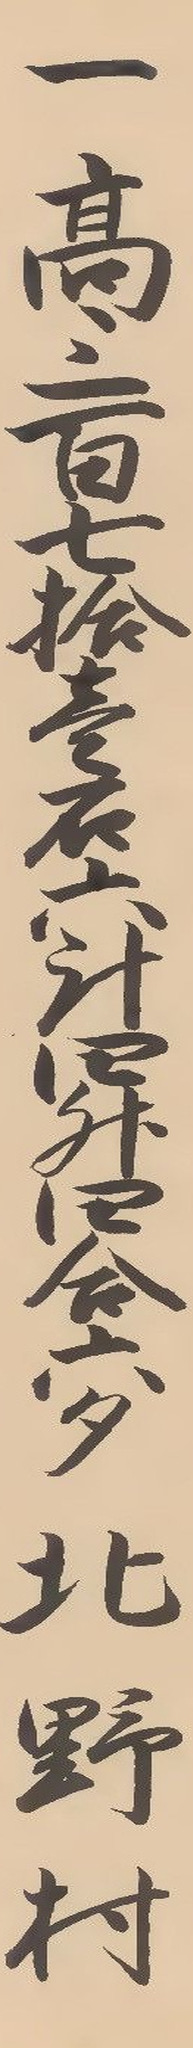一高三百七拾壱石六斗四升四合六勺北野村
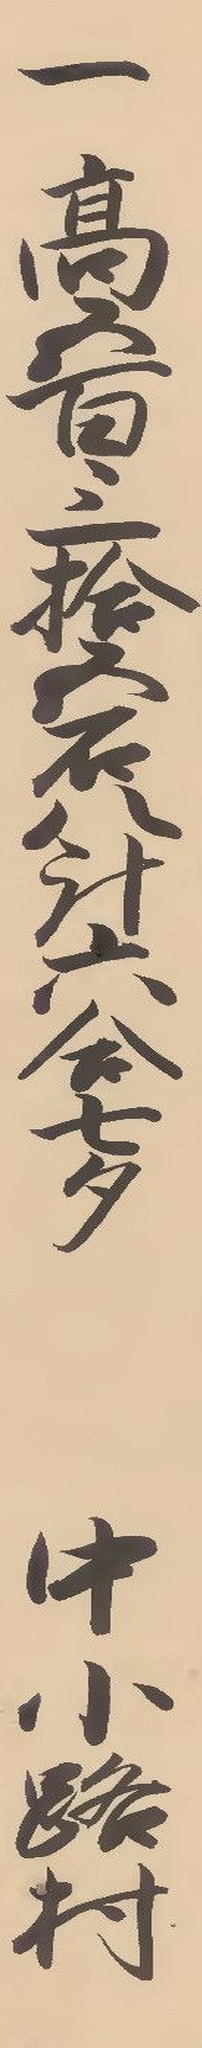一高五百三拾五石八斗六合七勺中小路村
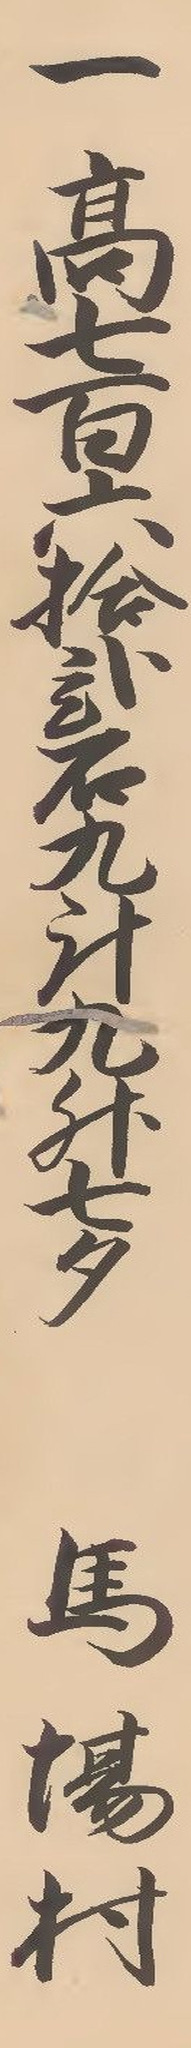一高七百六拾弐石九斗九升七勺馬場村

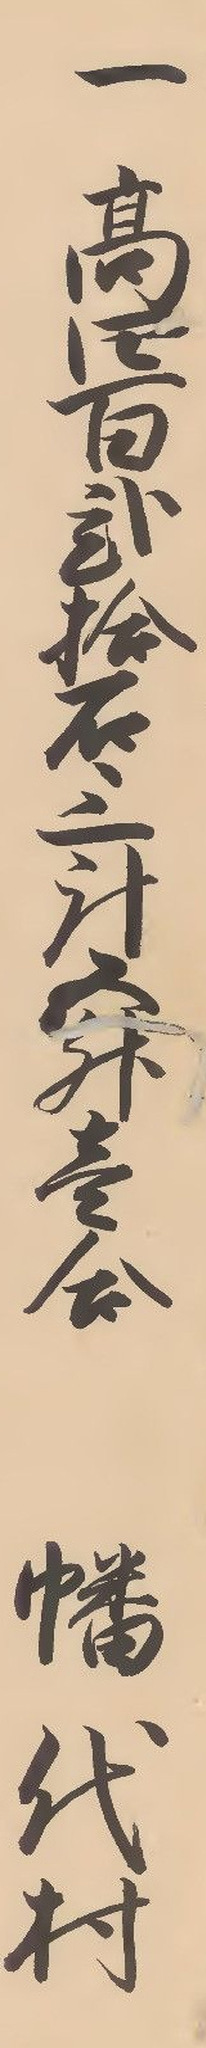一高四百弐拾石三斗五升壱合幡代村
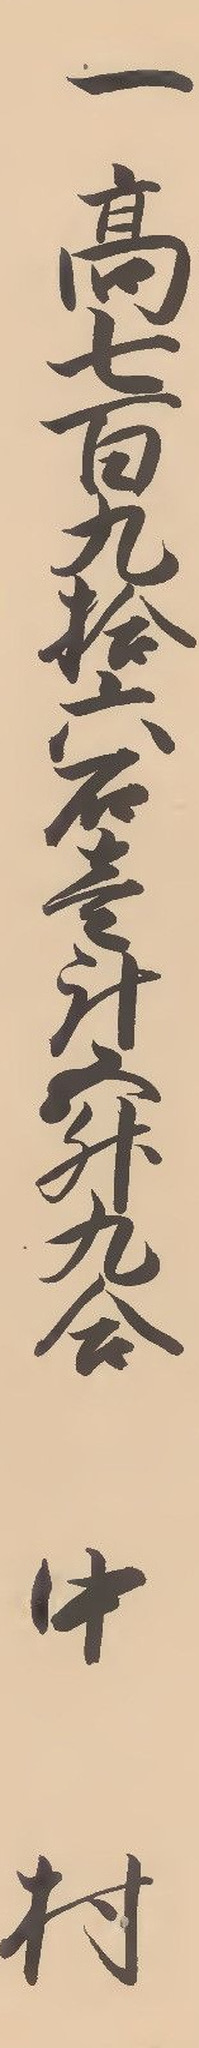一高七百九拾六石壱斗五升九合中村
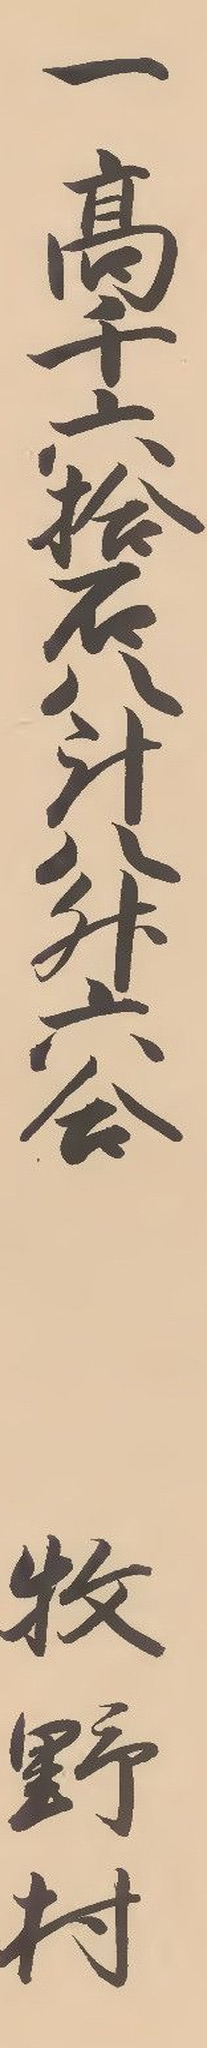一高千六拾石八斗八升六合牧野村
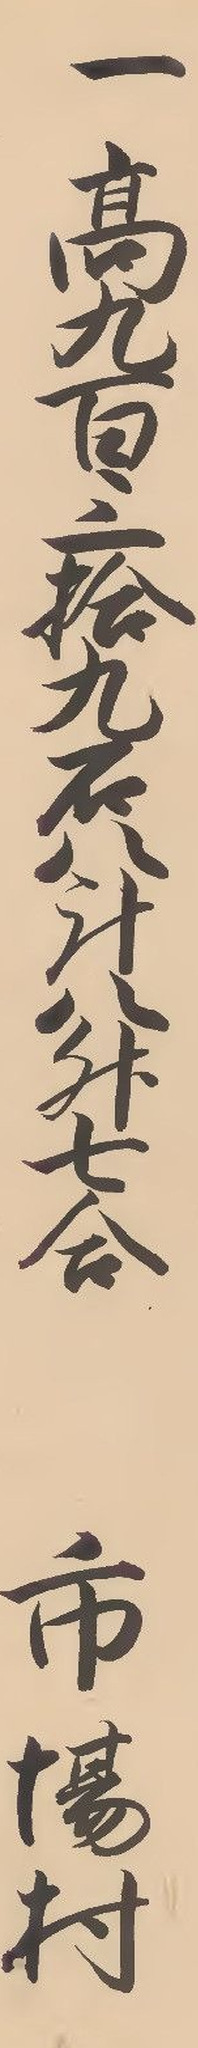一高九百三拾九石八斗八升七合市場村
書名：和泉国郷帳
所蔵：国立公文書館 National Archives of Japan
